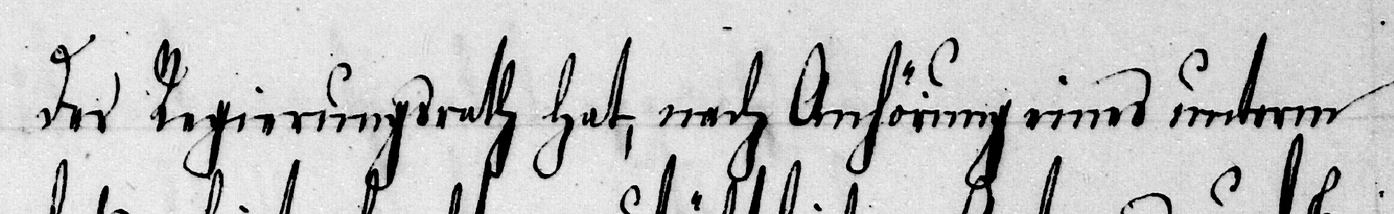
Der Regierungsrath hat, nach Anhörung eines unterm
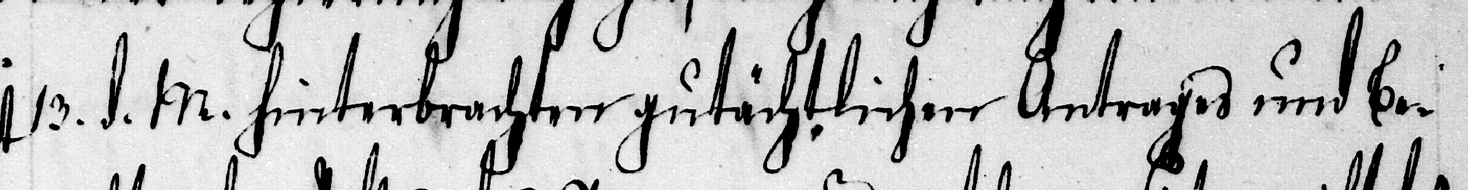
13. d. M. hinterbrachten gutächtlichen Antrages und Be¬
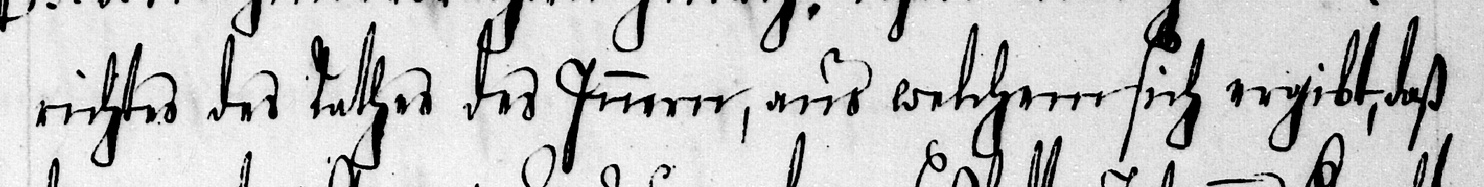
richtes des Rathes des Innern, aus welchem sich ergibt, daß
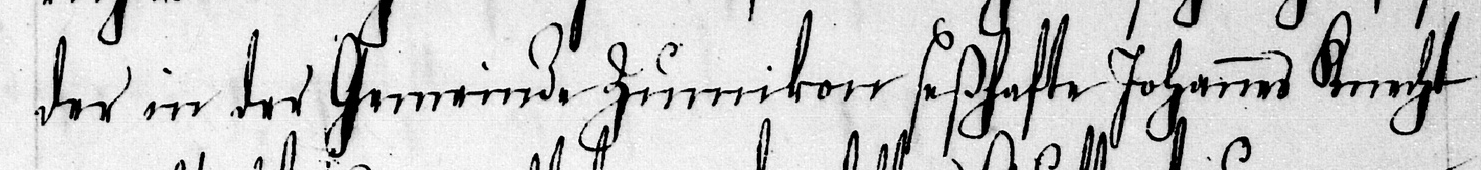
der in der Gemeinde Zumikon seßhafte Johannes Knecht
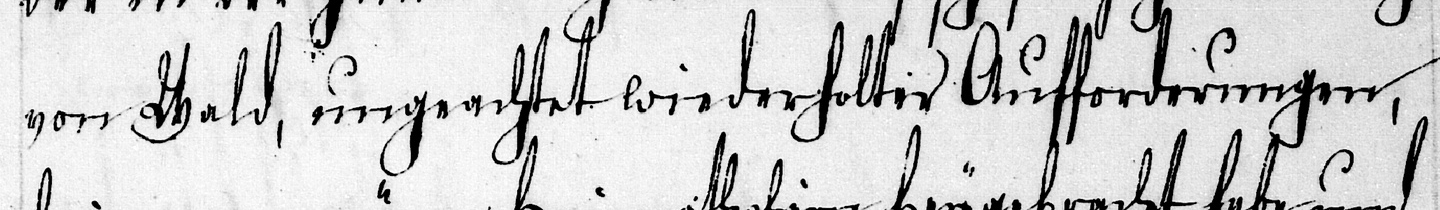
von Wald, ungeachtet wiederholter Aufforderungen,
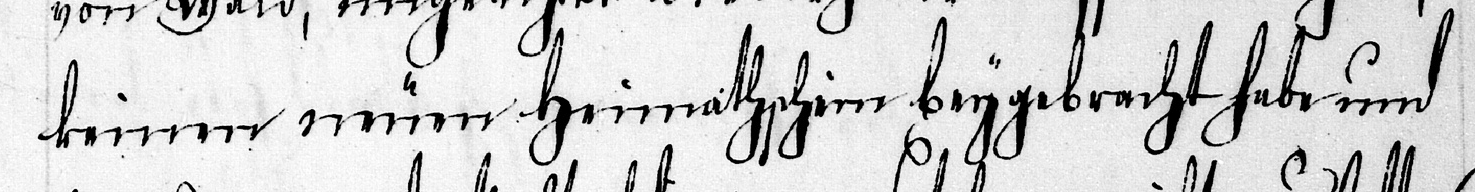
keinen neuen Heimathschein beygebracht habe und
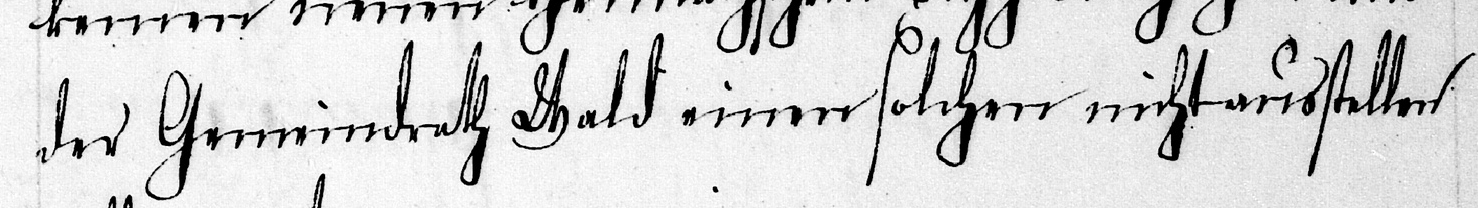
der Gemeindrath Wald einen solchen nicht ausstellen
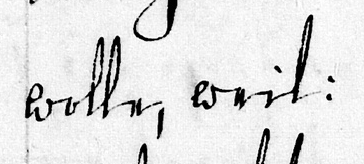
wolle, weil:
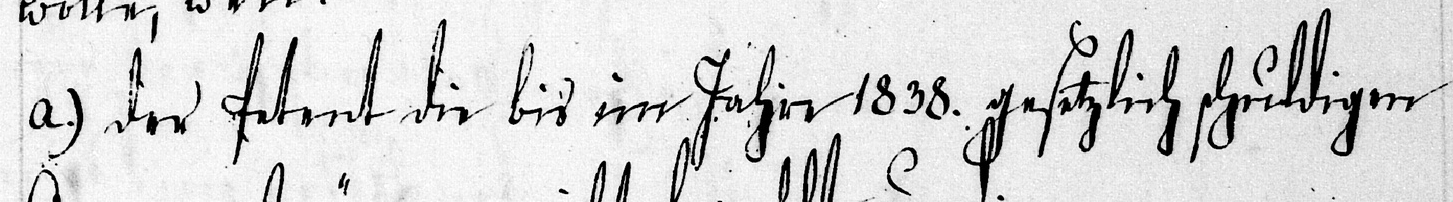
a.) der Petent die bis im Jahre 1838. gesetzlich schuldig¬
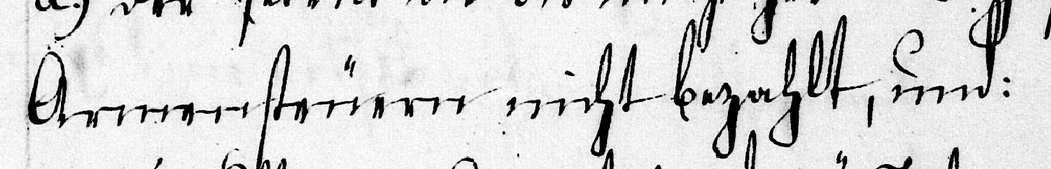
Armensteuern nicht bezahlt, und:
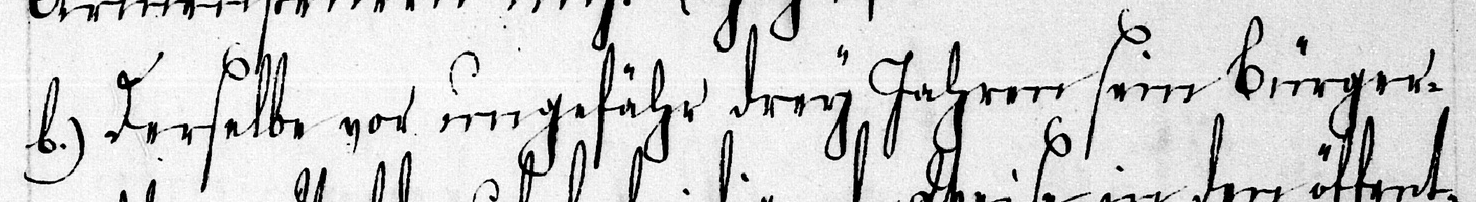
b.) Derselbe vor ungefähr drey Jahren sein Bürger¬
